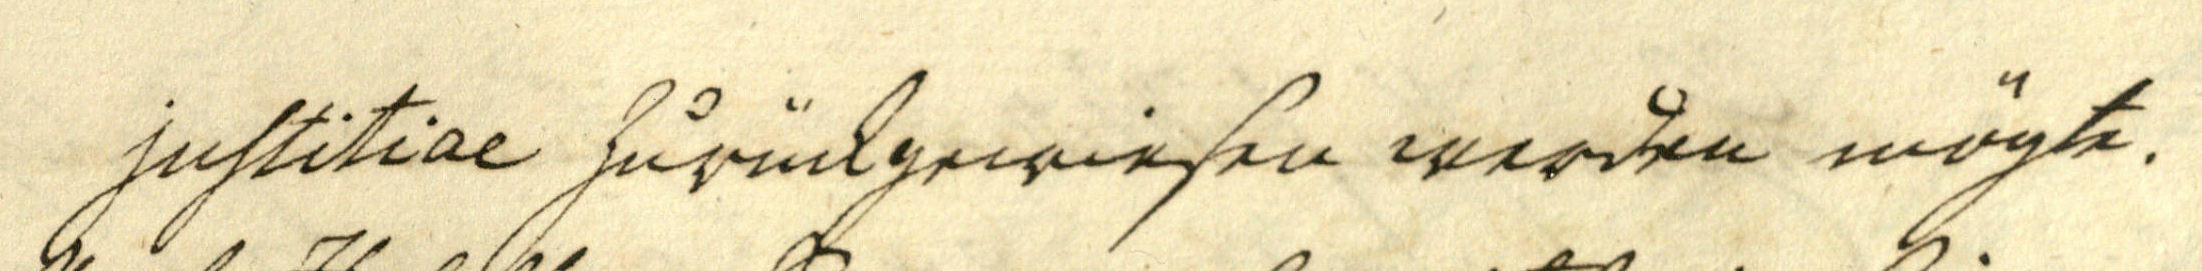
justitiae zurückgewiesen werden mögte.
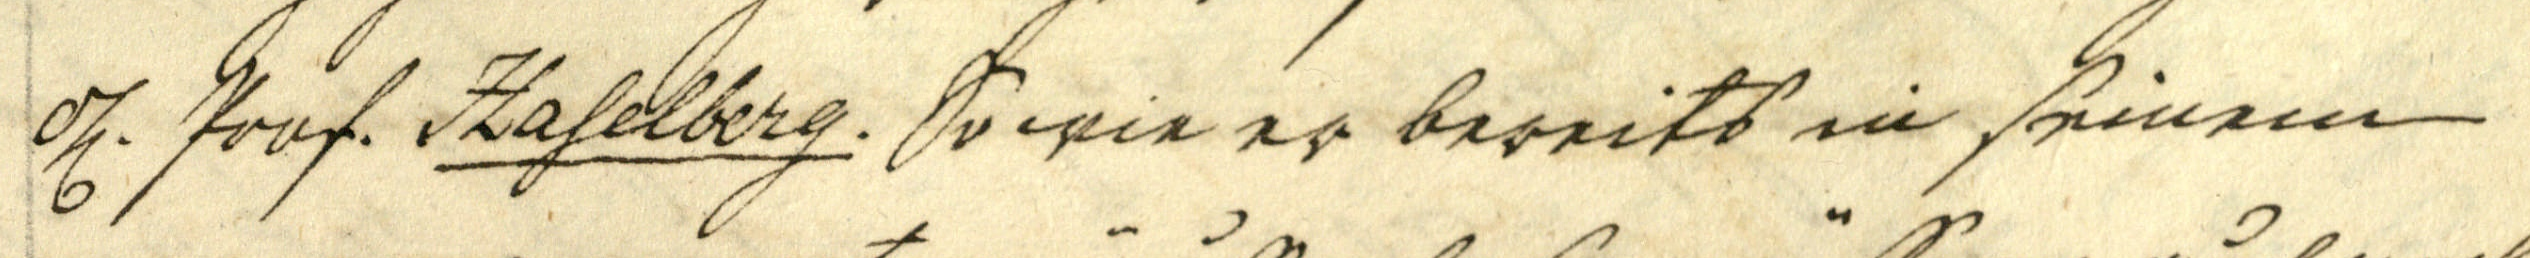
dh. Prof. Haselberg. So wie er bereits in seinem
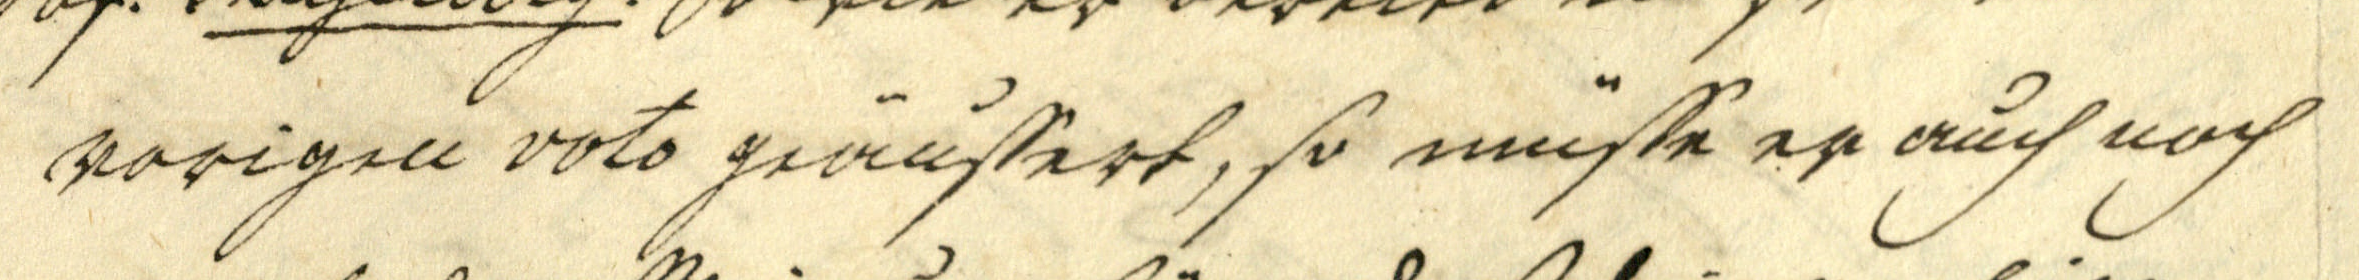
vorigen voto geäussert, so müsse er auch noch
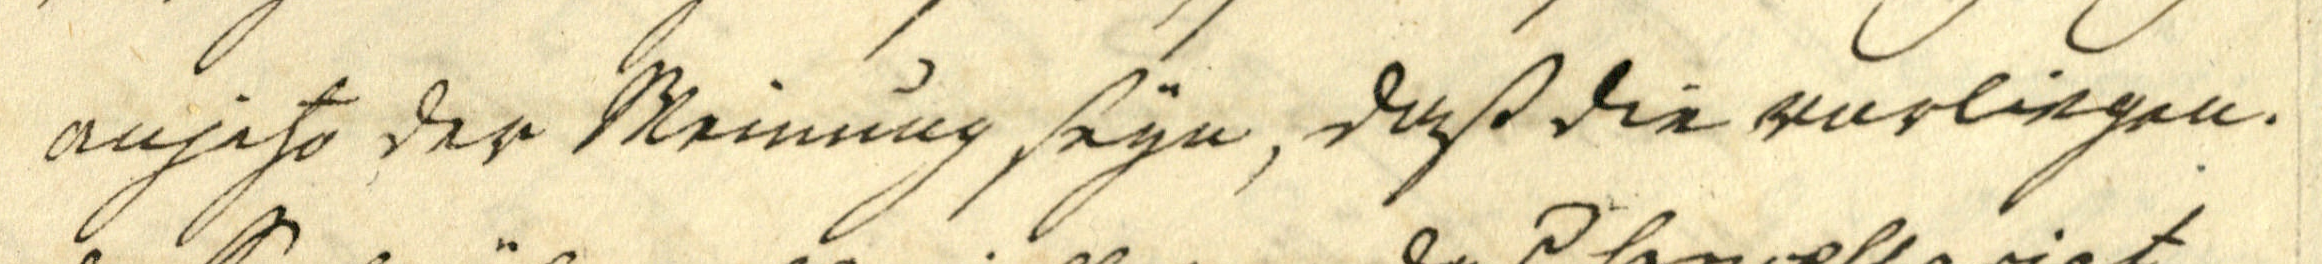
anjetzo der Meinung seÿn, daß die vorliegen¬
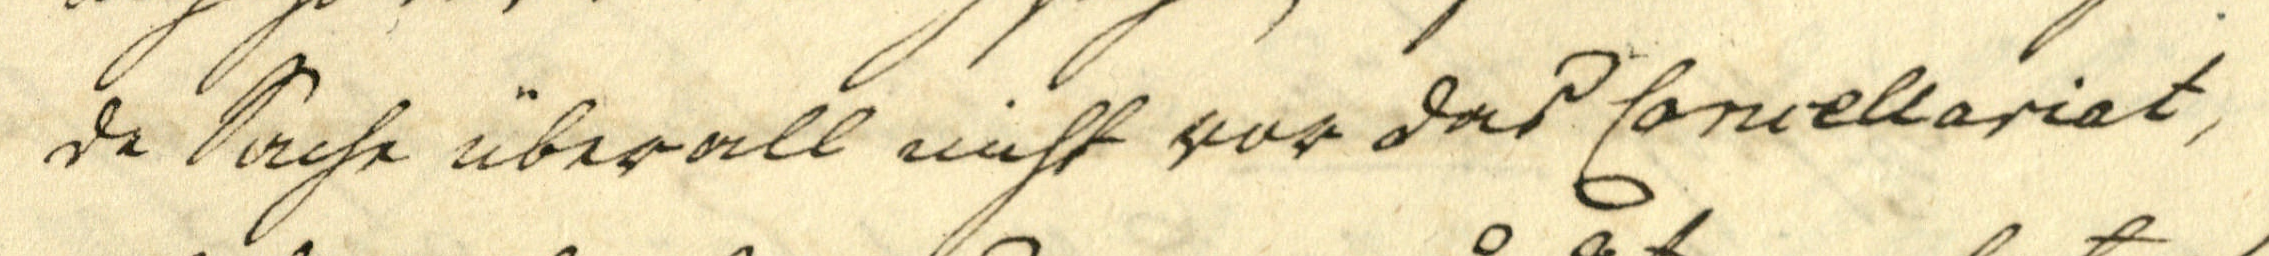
de Sache überall nicht vor das Cancellariat,
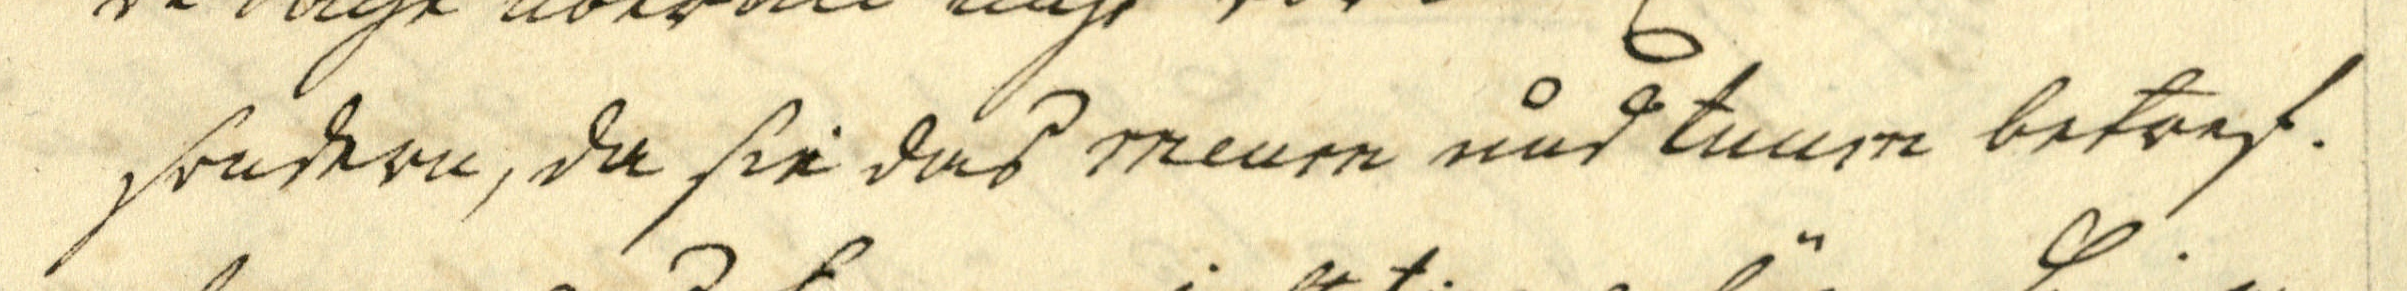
sondern, da sie das meum und tuum betref¬
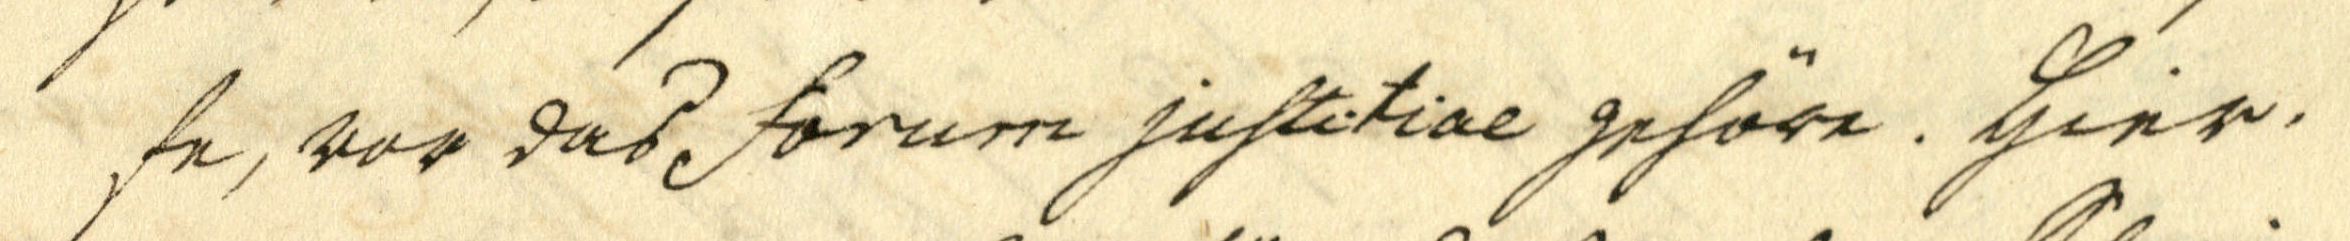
fe, vor das Forum justitiae gehöre. Hier¬
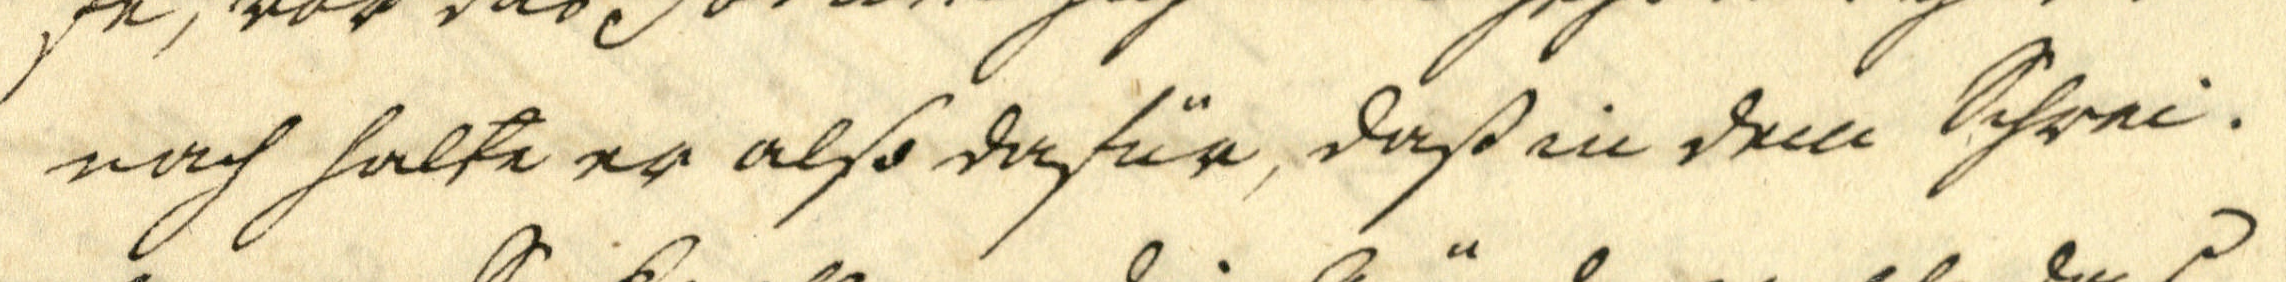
nach halte er also dafür, daß in dem Schrei¬
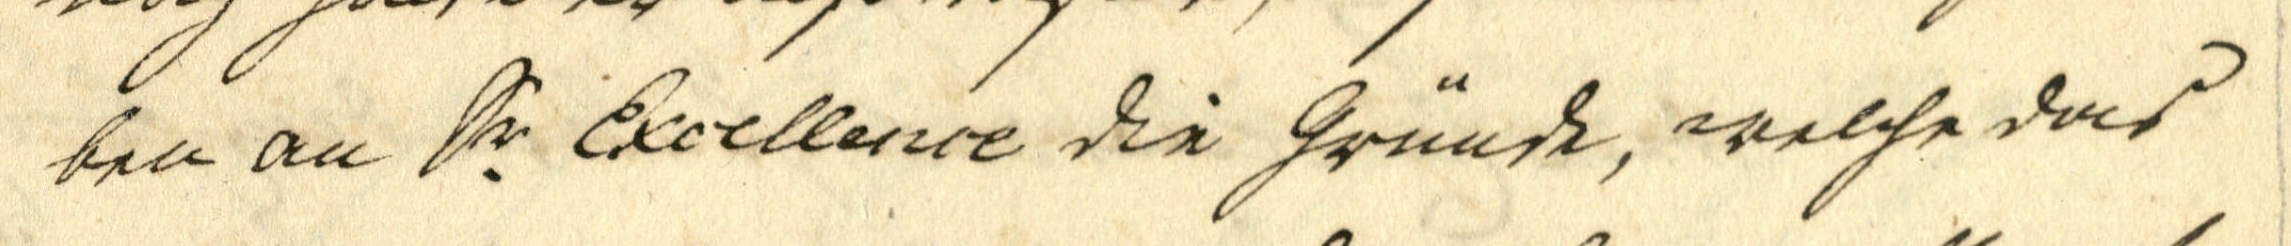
ben an Sr Excellence die Gründe, welche das
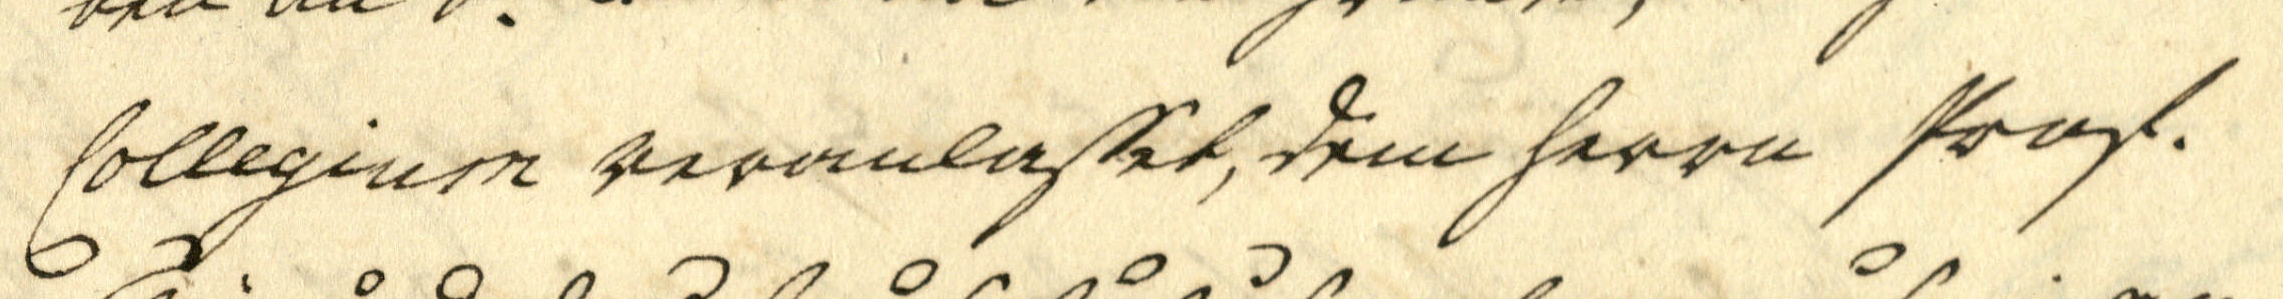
Collegium veranlasset, dem Herrn Prof.
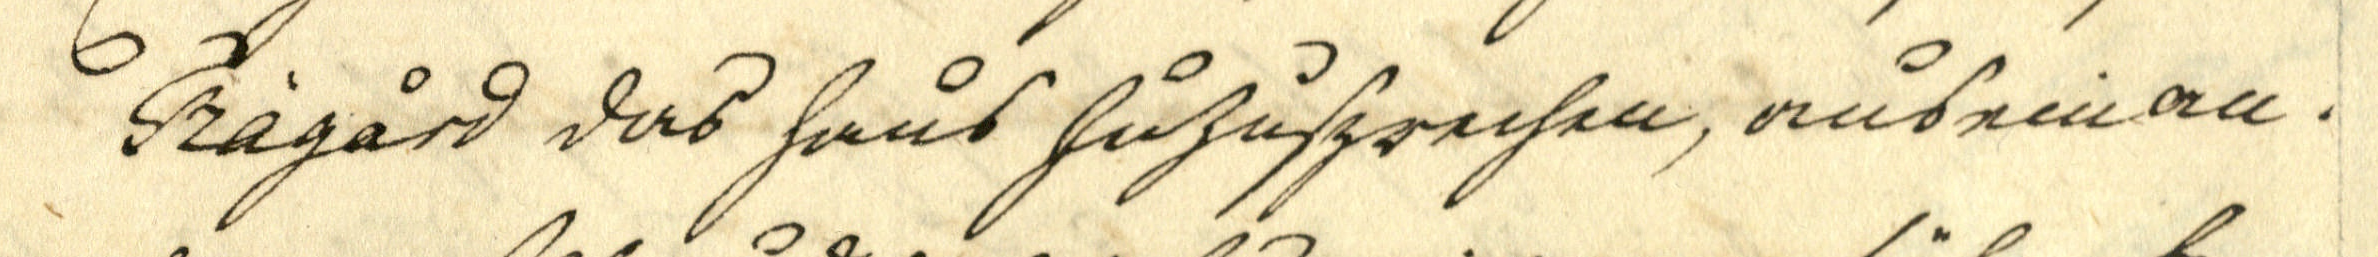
Trägård das Haus zuzusprechen, auseinan¬
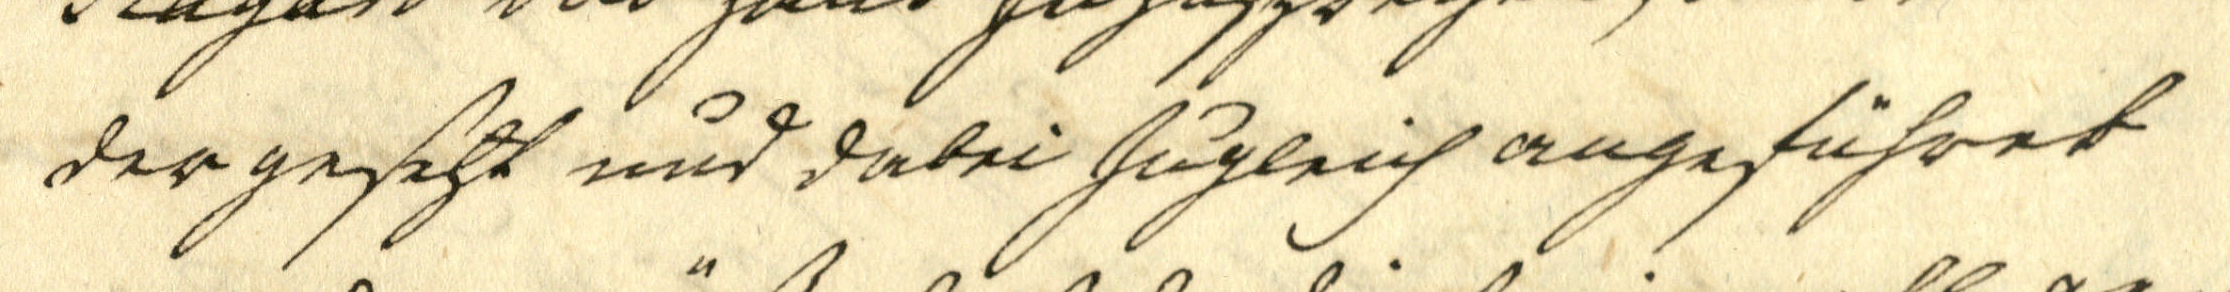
der gesetzt und dabei zugleich angeführet
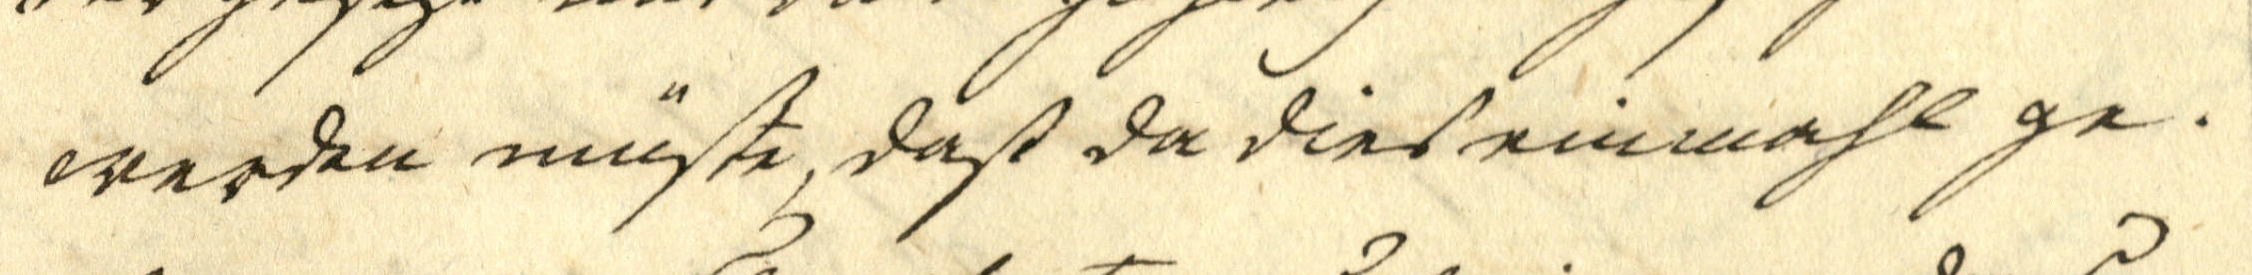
werden müßte, daß da dies einmahl ge¬
